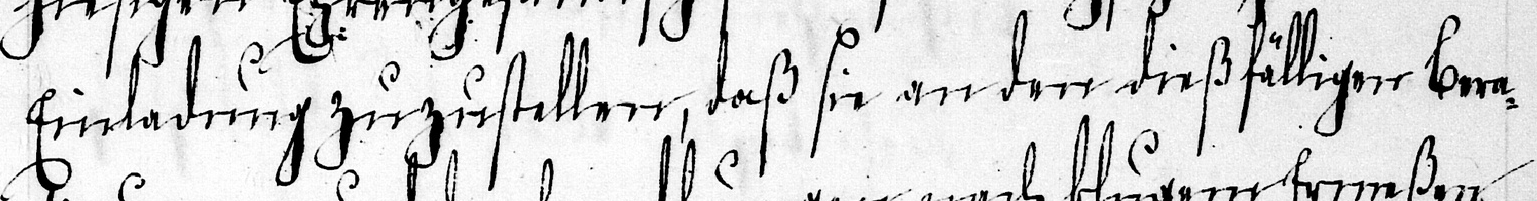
Einladung zuzustellen, daß sie an den dießfälligen Bera¬
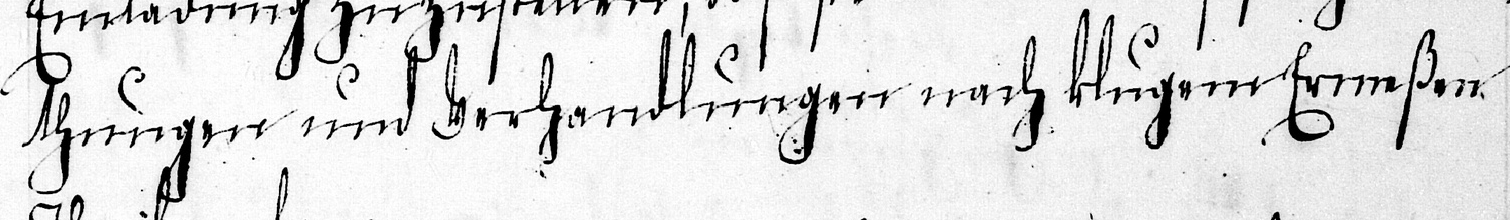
thungen und Verhandlungen nach klugem Ermeßen
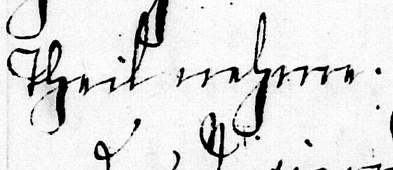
Theil nehme.
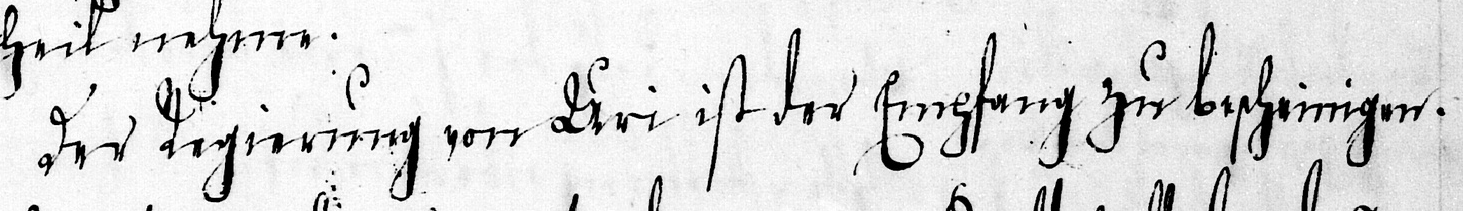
Der Regierung von Uri ist der Empfang zu bescheinigen.
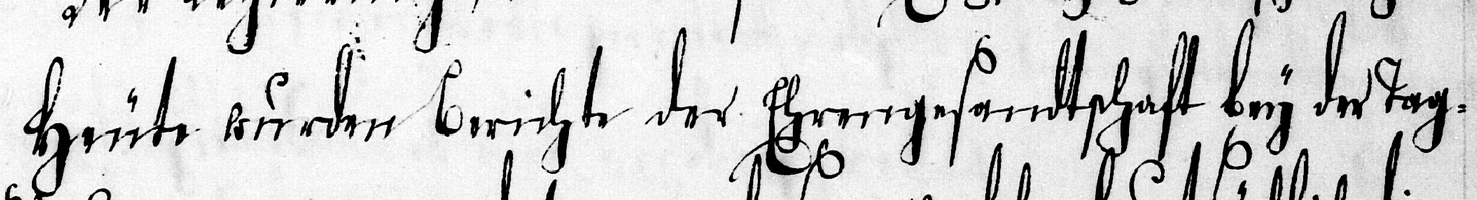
Heute wurden Berichte der Ehrengesandtschaft bey der Tag¬
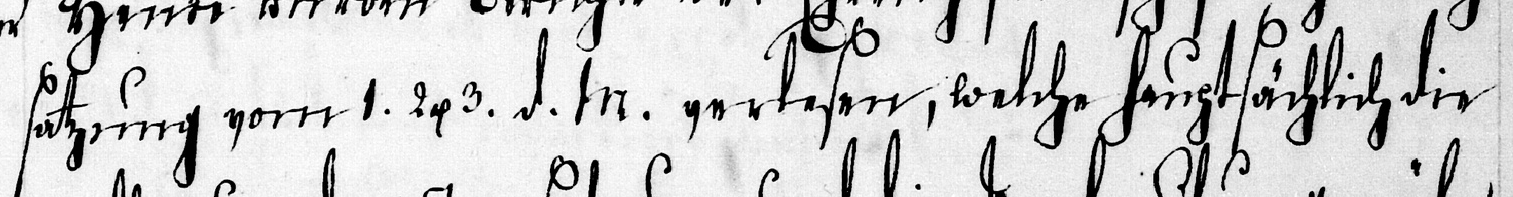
satzung vom 1. 2 u 3. d. M. verlesen, welche hauptsächlich die
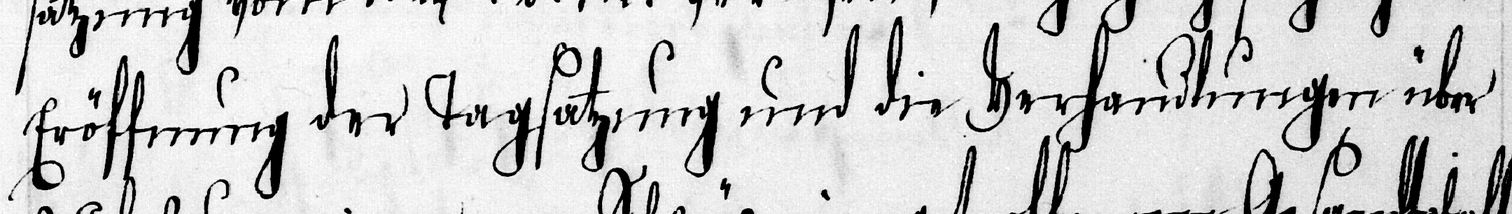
Eröffnung der Tagsatzung und die Verhandlungen über
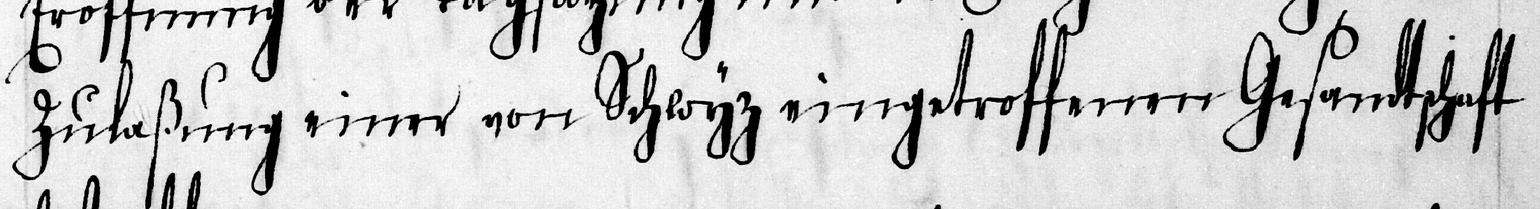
Zulaßung einer von Schwyz eingetroffenen Gesandtschaft
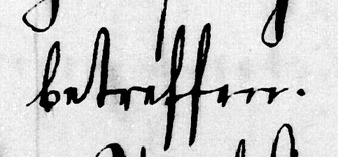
betreffen.
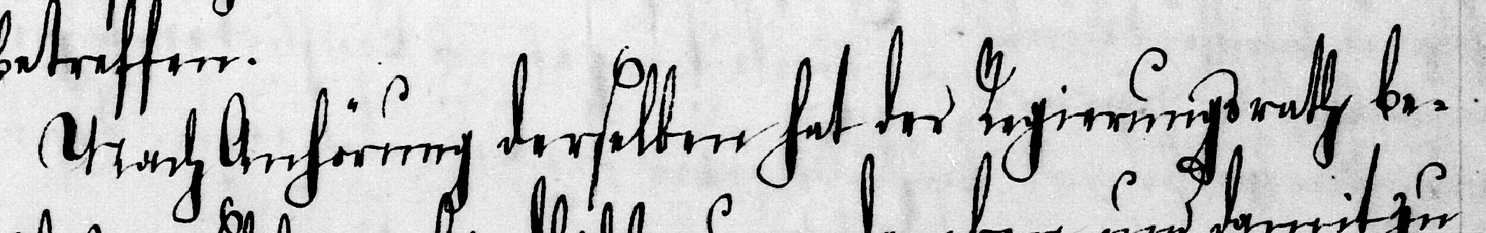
Nach Anhörung derselben hat der Regierungsrath be¬
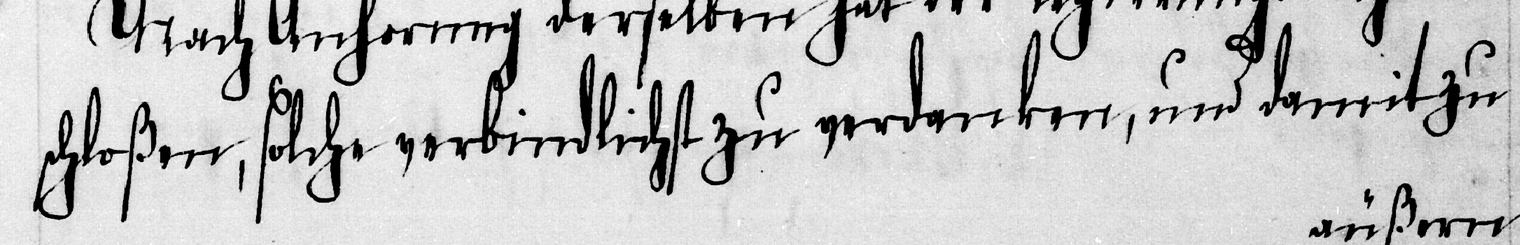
schloßen, solche verbindlichst zu verdanken, und damit zu
